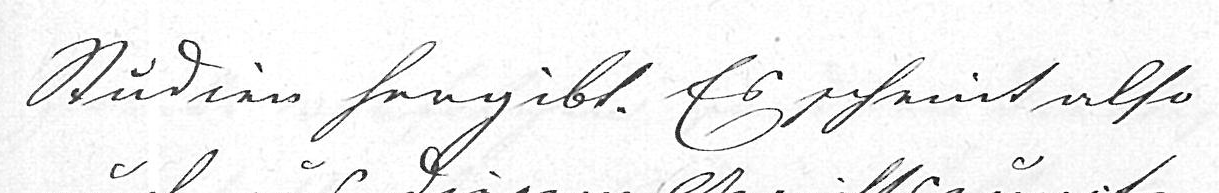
Studien hergibt. Es scheint also
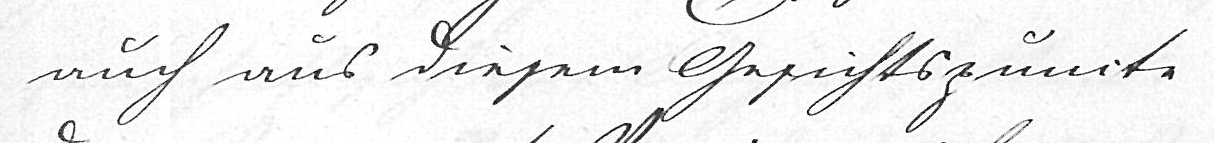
auch aus diesem Gesichtspuncte
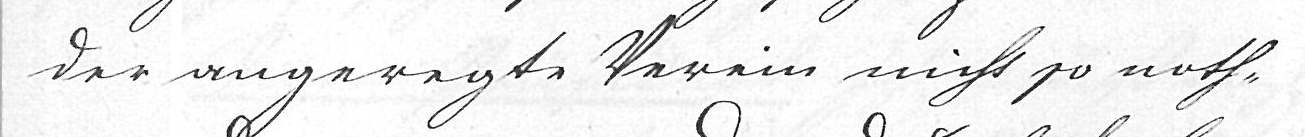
der angeregte Verein nicht so noth-
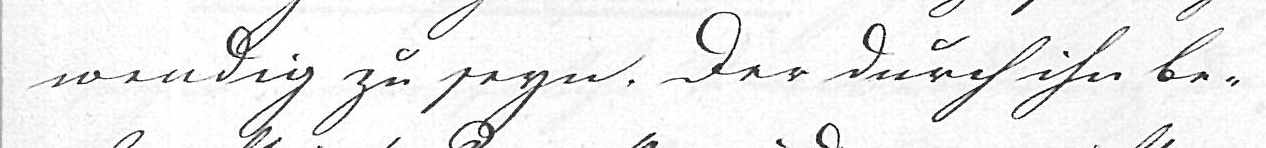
wendig zu seyn. Der durch ihn be-
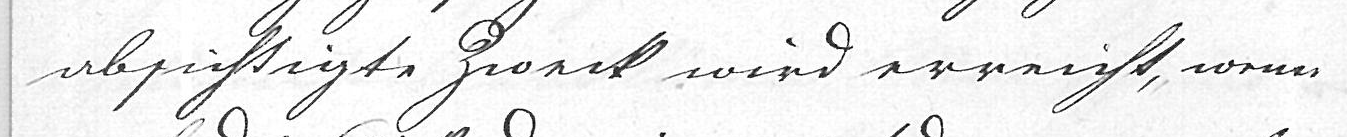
absichtigte Zweck wird erreicht, wenn
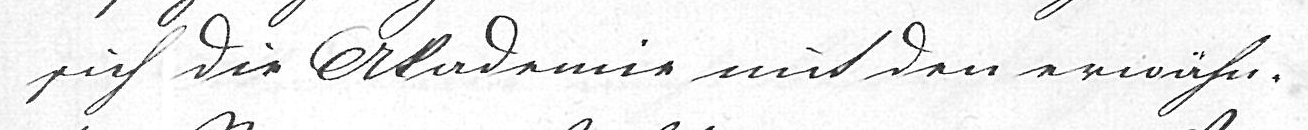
sich die Akademie mit den erwähn-
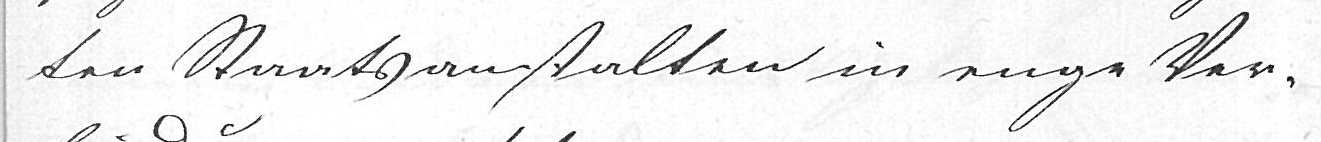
ten Staatsanstalten in enge Ver-
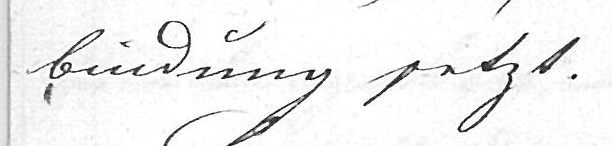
bindung setzt.
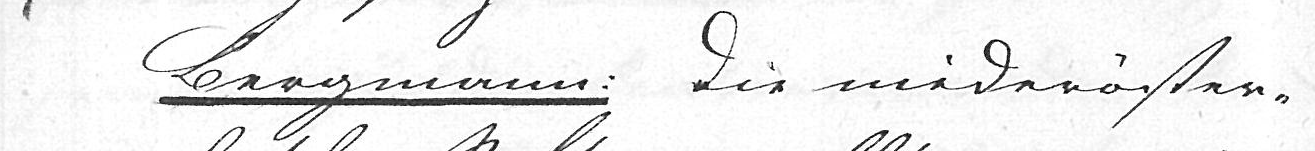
Bergmann: Die niederöster-
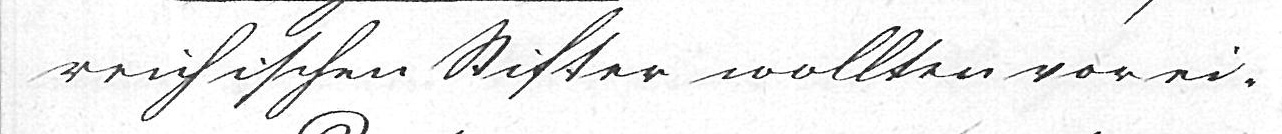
reichischen Stifter wollten vorei-
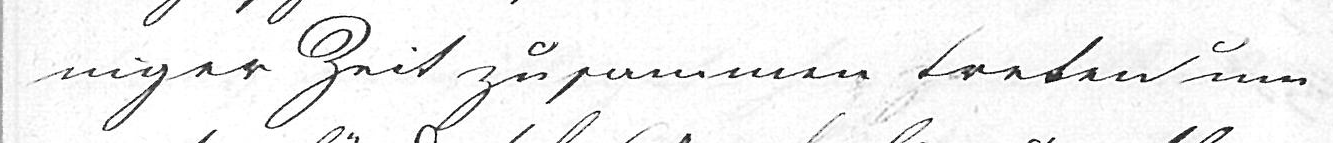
niger Zeit zusammen treten um
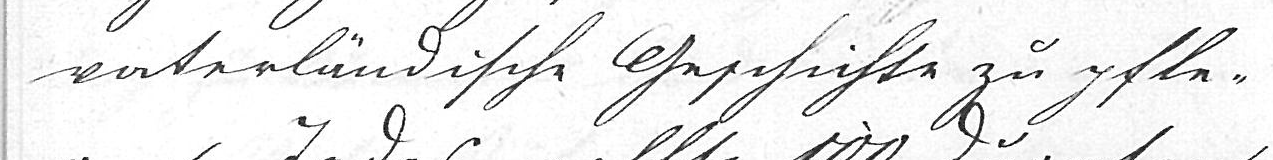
vaterländische Geschichte zu pfle--
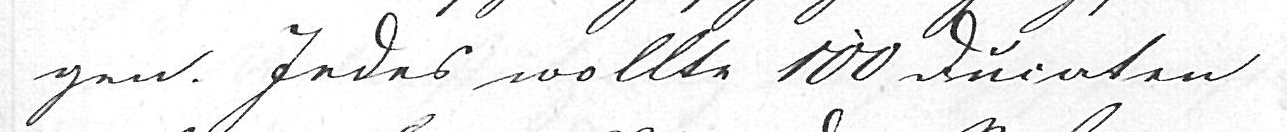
gen. Jedes wollte 100 Ducaten
